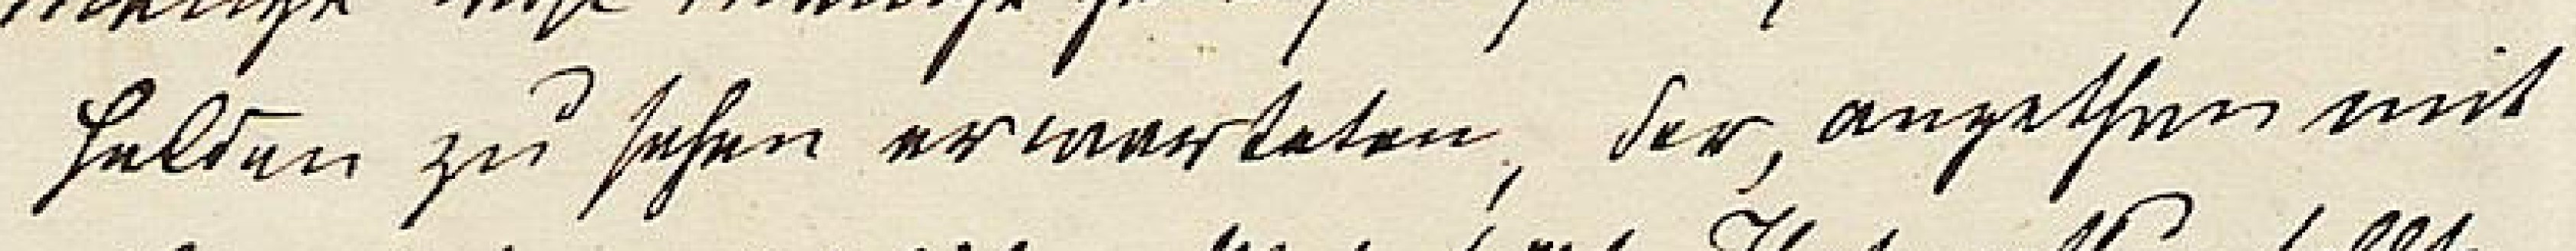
Helden zu sehen erwarteten, der angethan mit
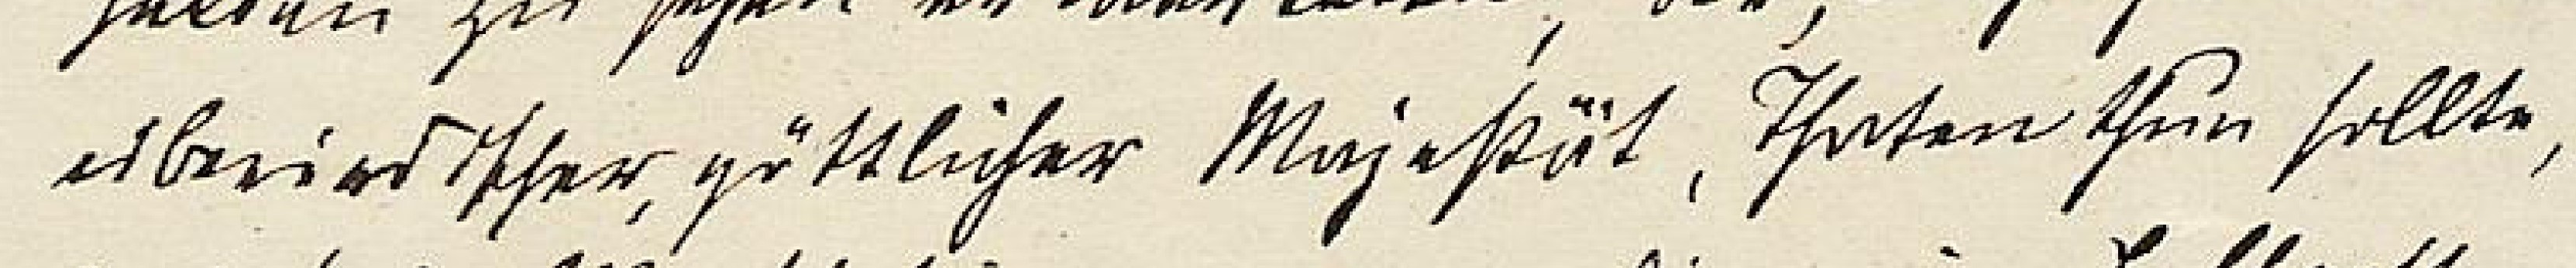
überirdischer, göttlicher Majestät, Thaten thun sollte,
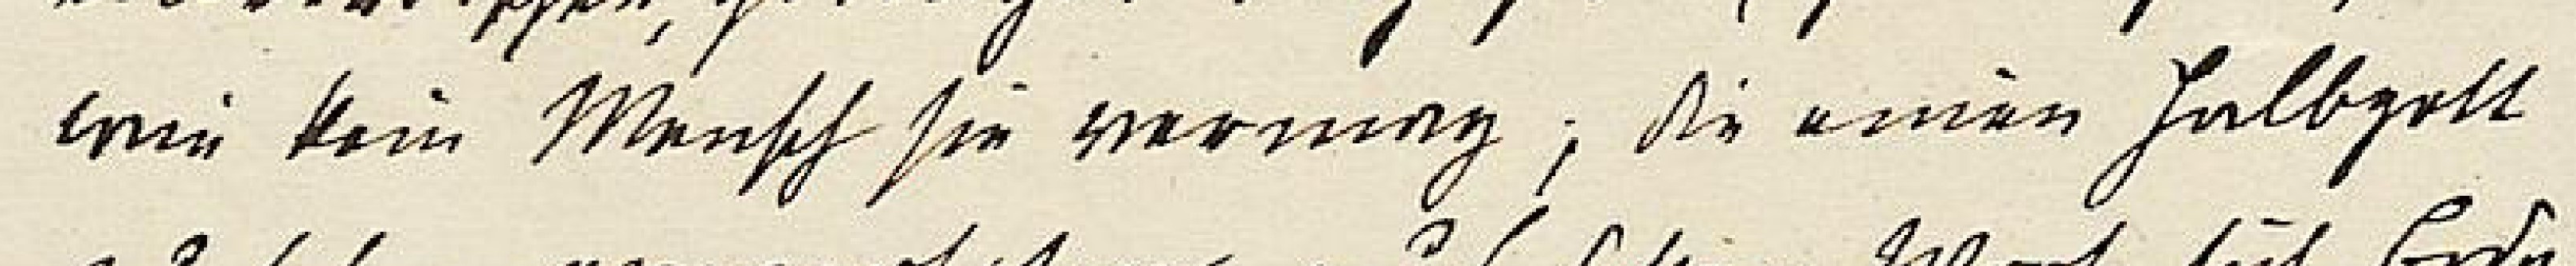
wie kein Mensch sie vermag, die einen Halbgott
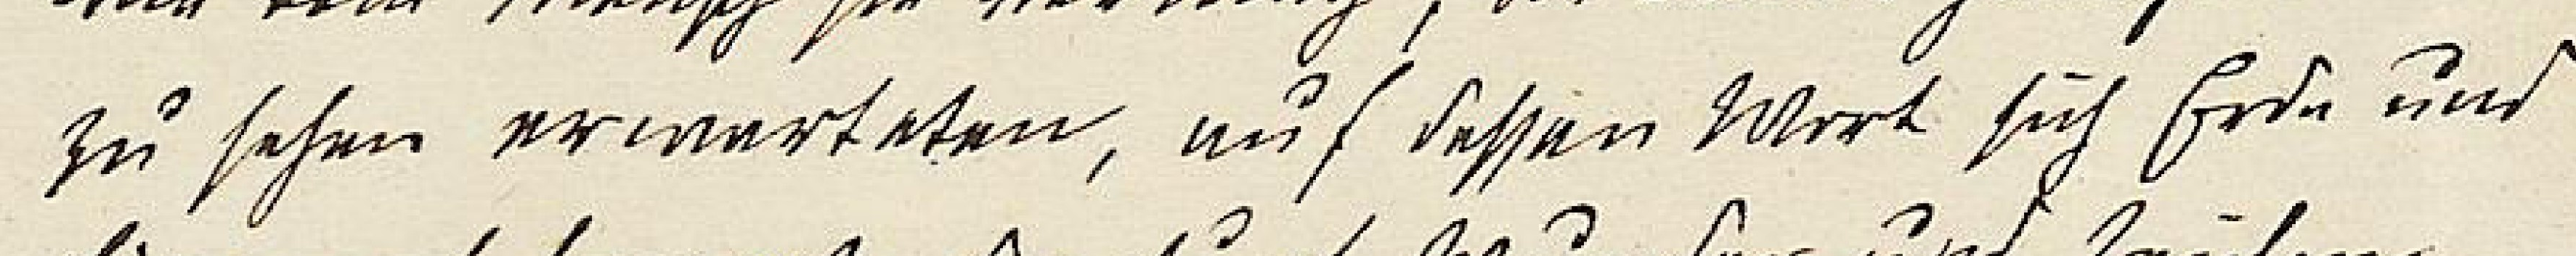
zu sehen erwarteten, auf dessen Wort sich Erde und
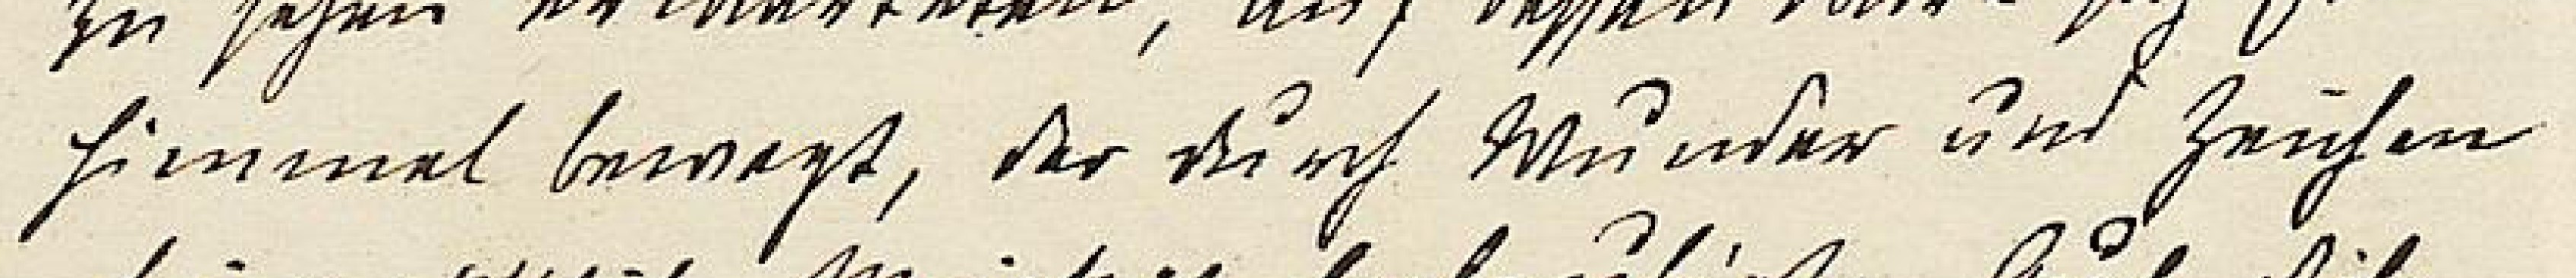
Himmel bewegt, der durch Wunder und Zeichen
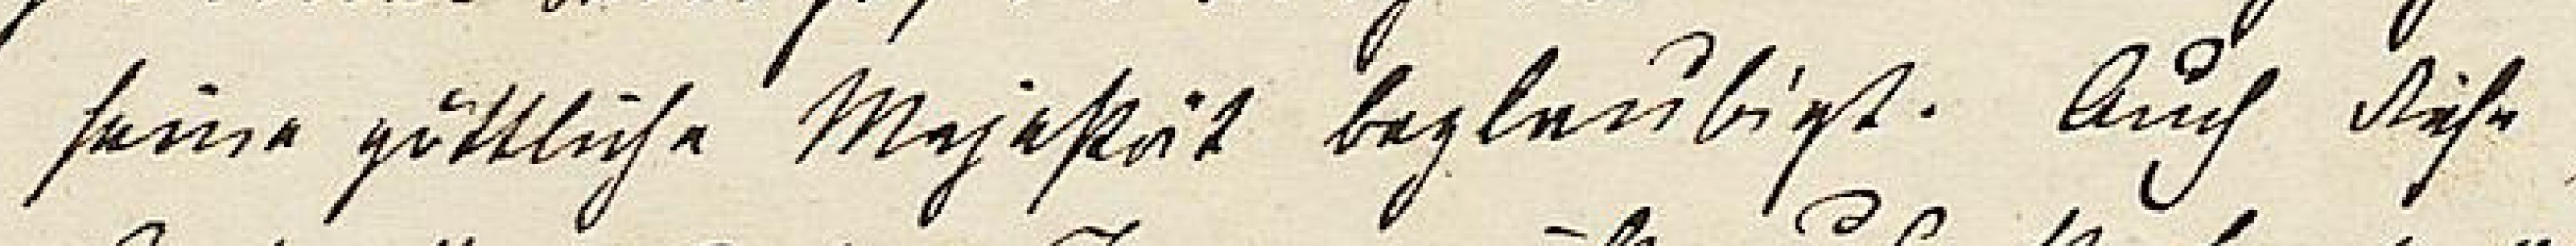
seine göttliche Majestät beglabigt. Auch diese
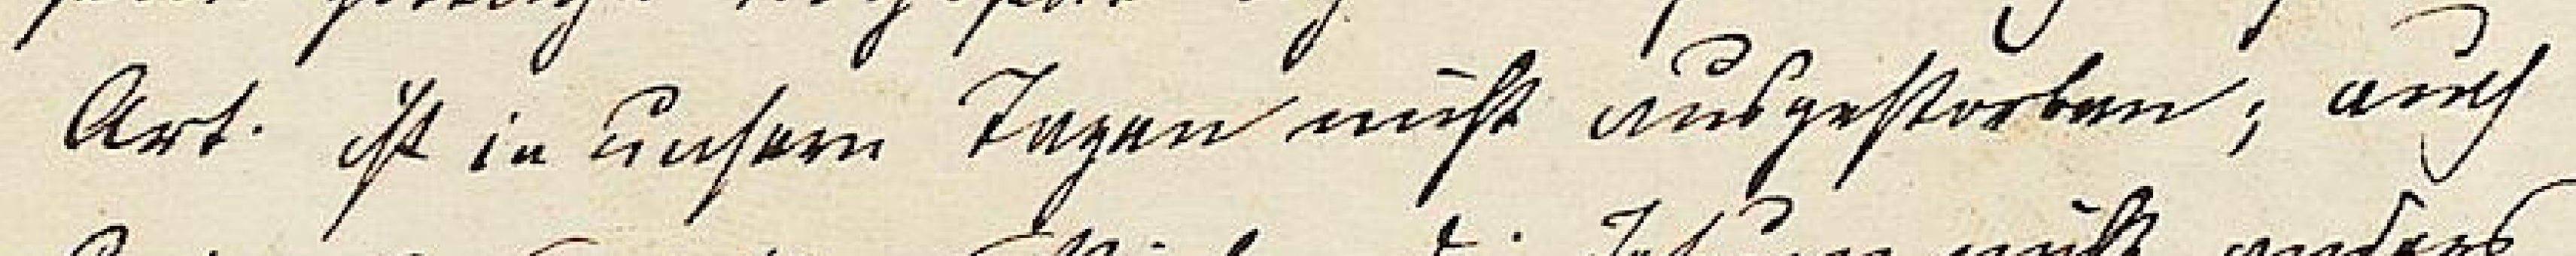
Art ist in unsern Tagen nicht ausgestorben, auch
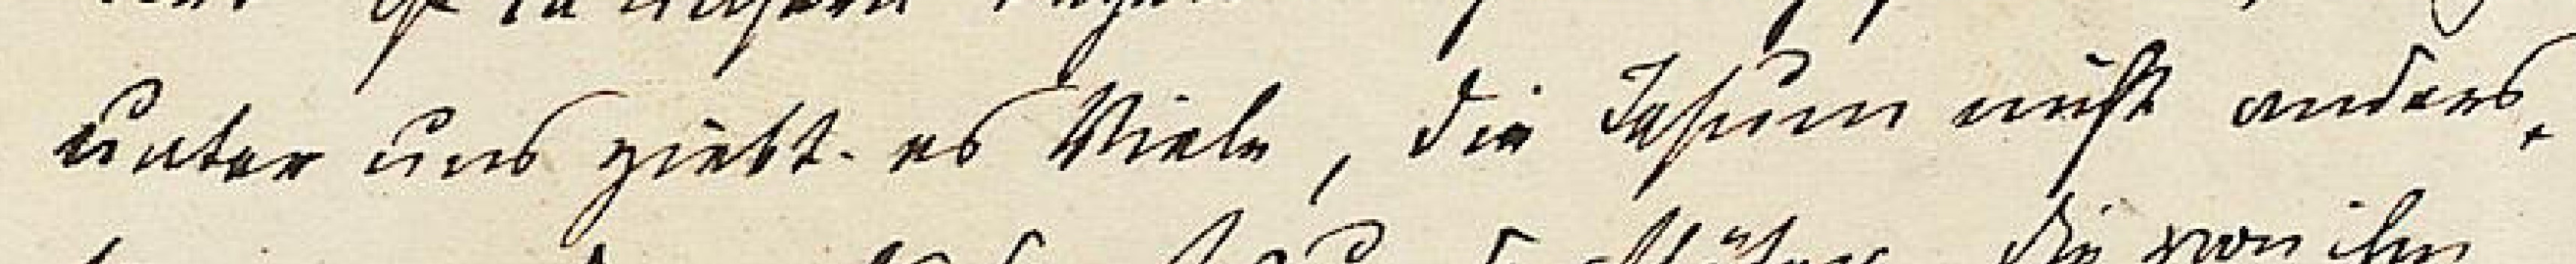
unter uns giebt es Viele, die Jesum nicht anders
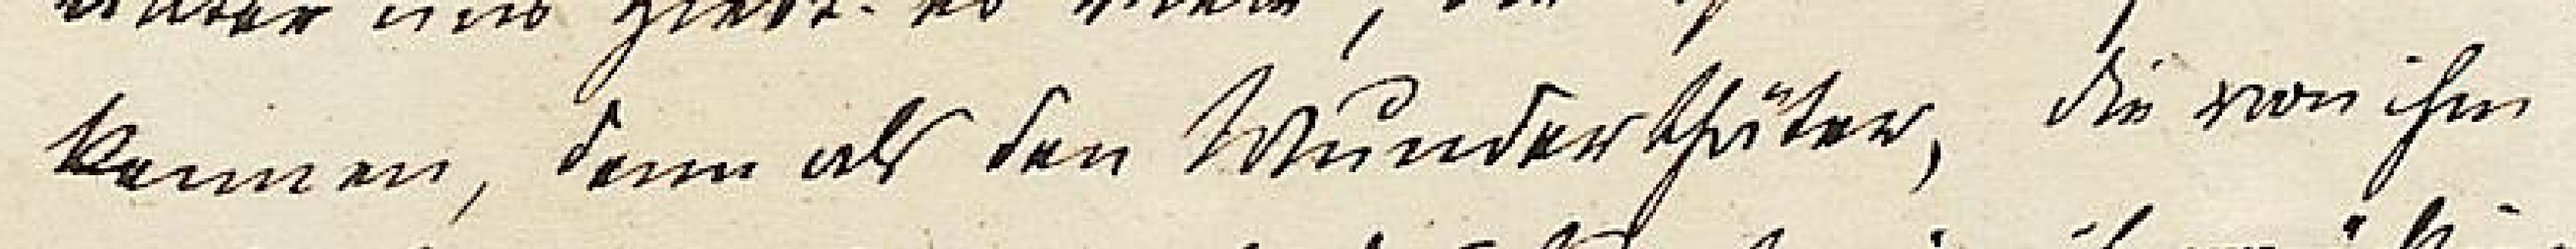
kennen, denn als den Wunderthäter, die von ihm
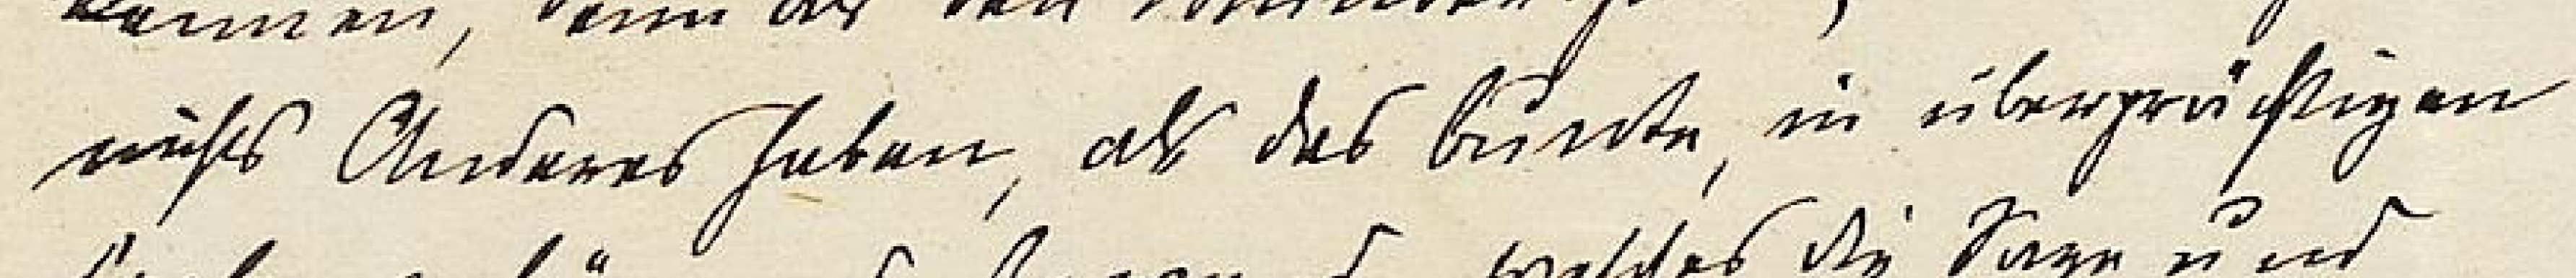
nichts Anderes haben, als das bunte, in überprächtigen
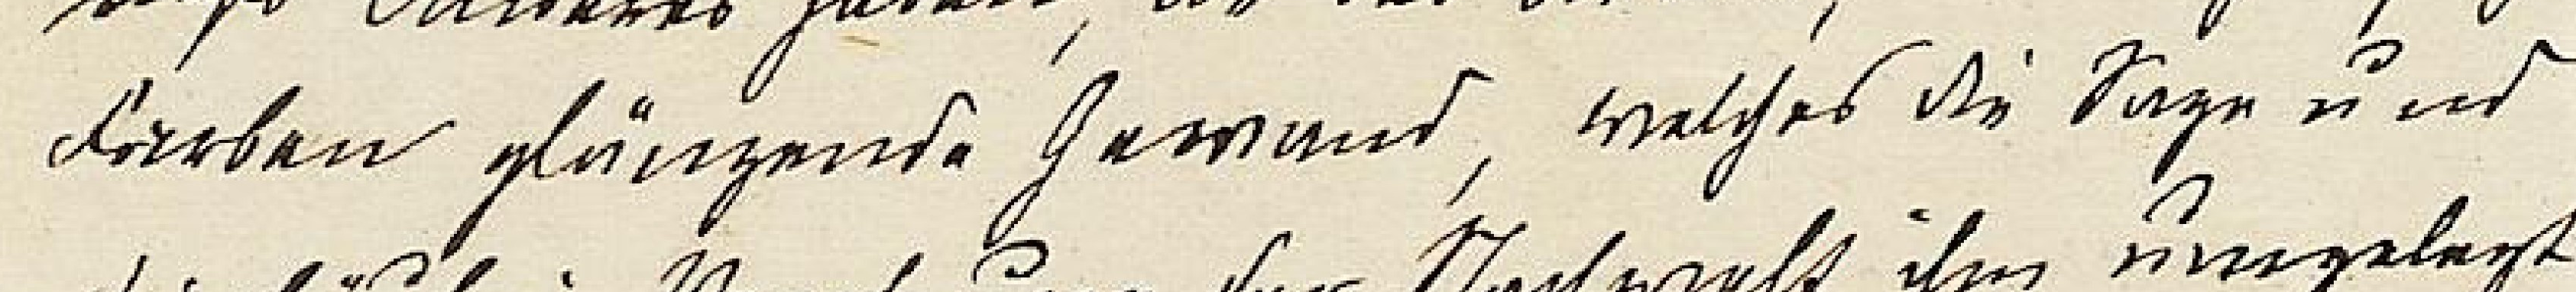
Farben glänzende Gewand, welches die Sage und
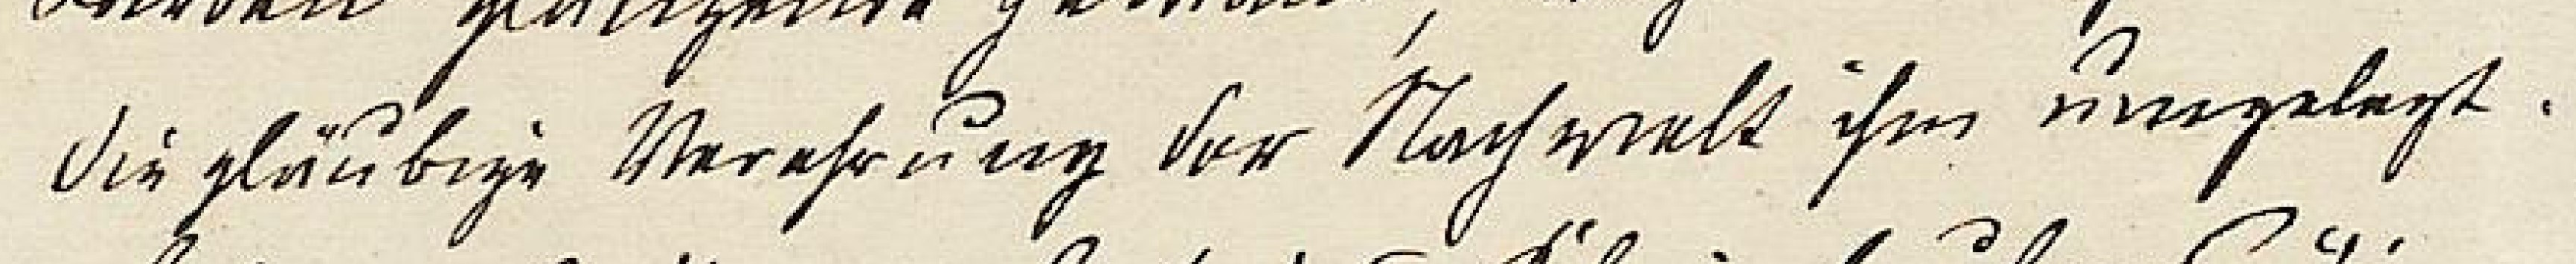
die gläubige Verehrung der Nachwelt ihm umggelegt
